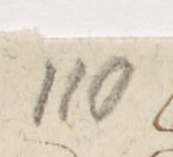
110
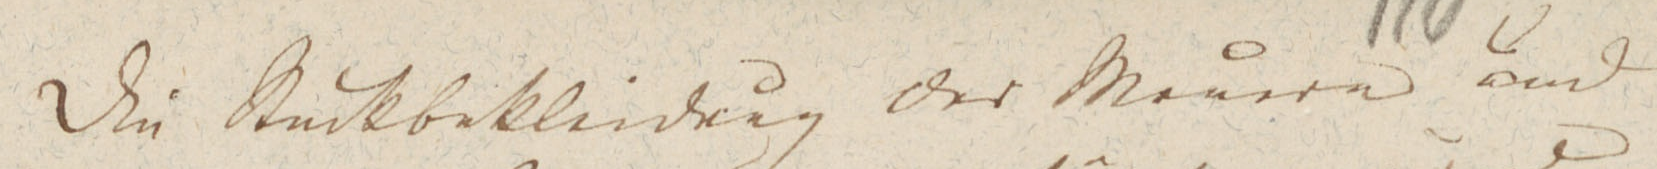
Die Stuckbekleidung der Mauern und
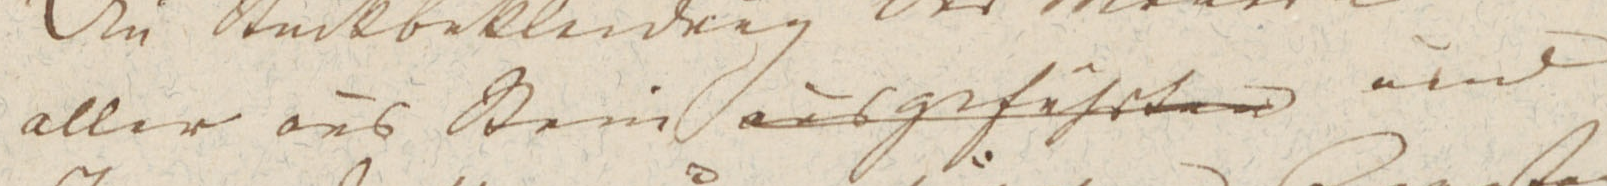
aller aus Stein ausgeführten und
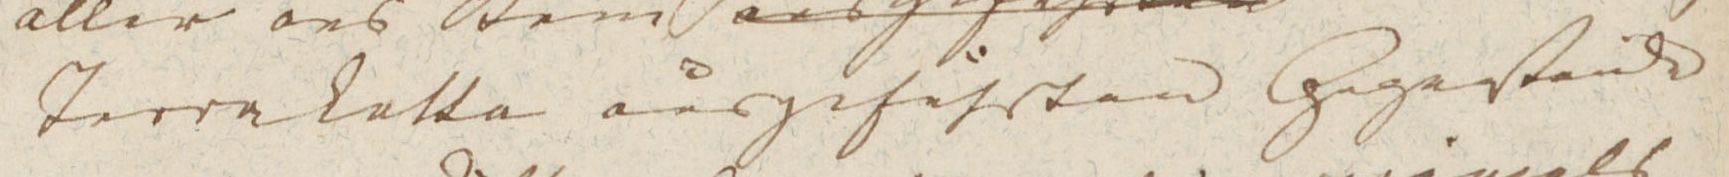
Terrakotta ausgeführten Gegenstände %
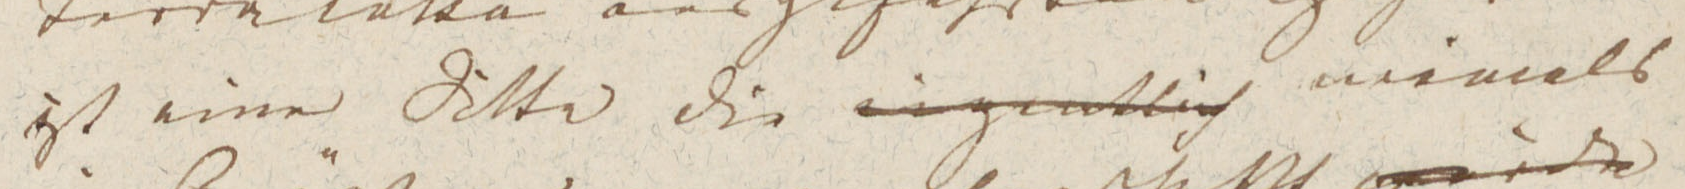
ist eine Sitte die eigentlich niemals
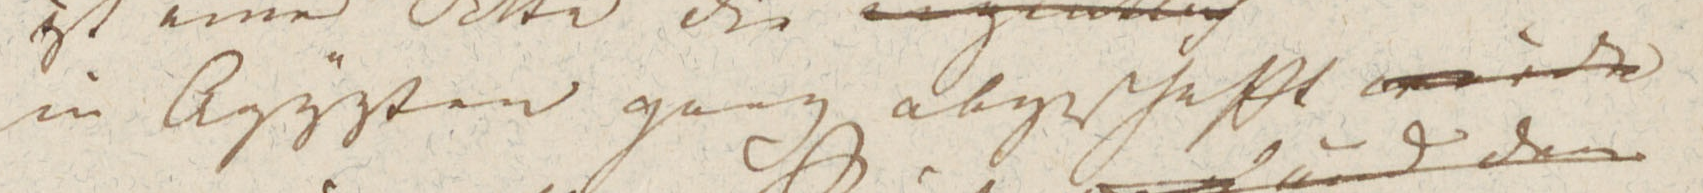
in Aegypten ganz abgeschafft wurde
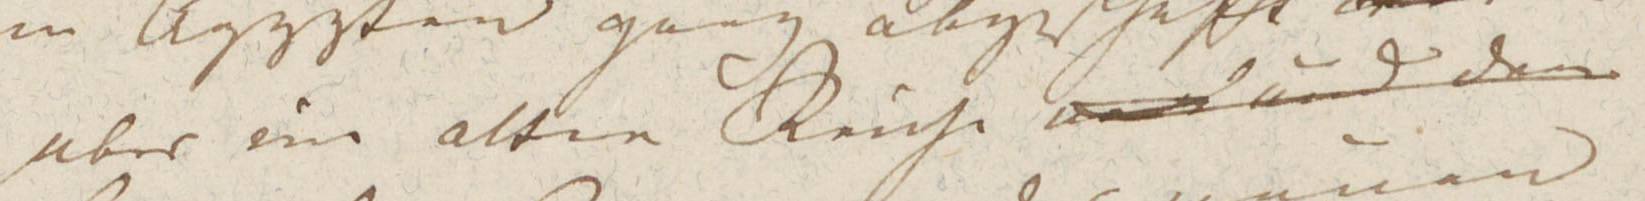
aber im alten Reiche noch und den
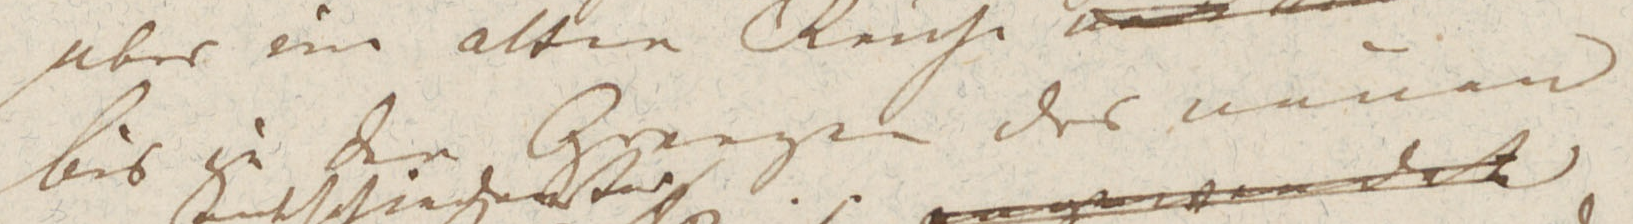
bis zu den Grenzen des neuen
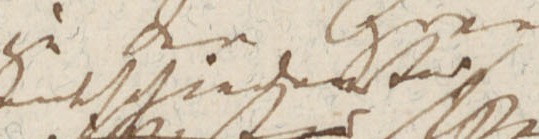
hinab in naivester
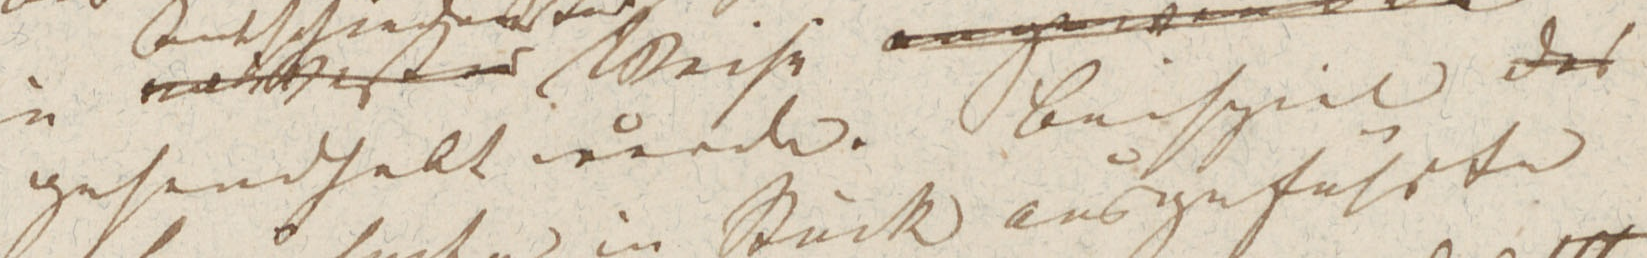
gehandhabt wurde. Beispiel das
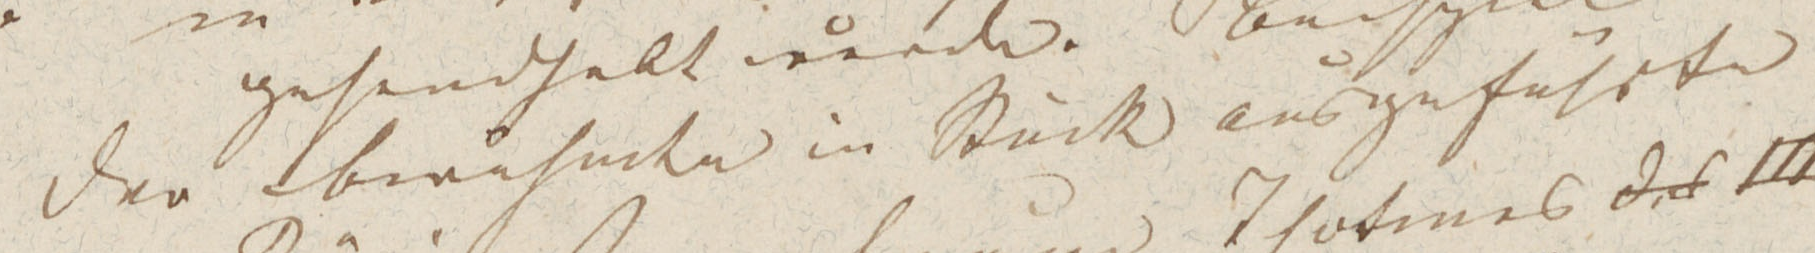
der berühmte in Stuck ausgeführte
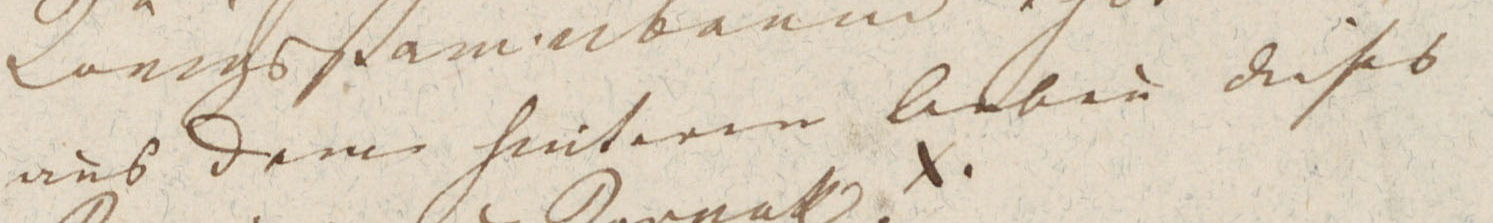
aus dem heiteren Anbau dieses
